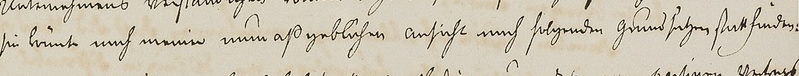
sie könnte nach meiner unmaßgeblichen Ansicht nach folgenden Grundsätzen stattfinden:
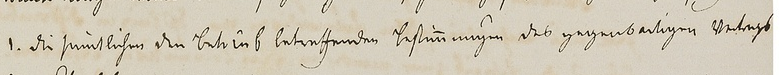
1. Die sämtlichen den Betrieb betreffenden Bestimmungen des gegenwärtigen Vertrags
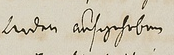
werden aufgehoben
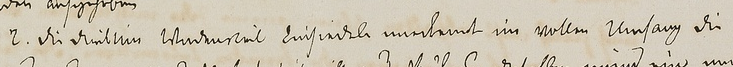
2. Die Direktion WädensweilEinsiedeln anerkennt im vollen Umfang die
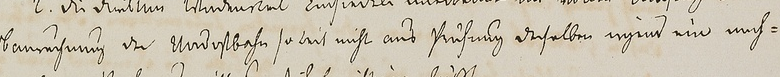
Baurechnung der Nordostbahn so weit nicht aus Prüfung derselben irgend ein nach-
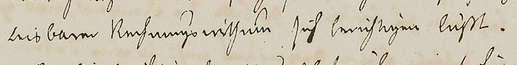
weisbarer Rechnungsirrthum sich berichtigen läßt.
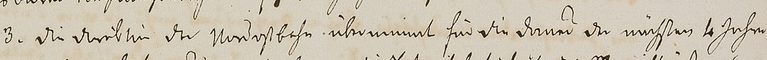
3. Die Direktion der Nordostbahn übernimmt für die Dauer der nächsten 4 Jahre
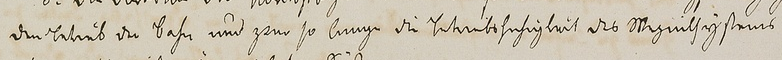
den Betrieb der Bahn und zwar so lange die Betriebsfähigkeit des Spezialsystems
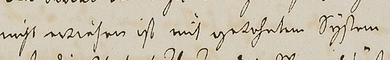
nicht erwiesen ist mit gewohntem System.
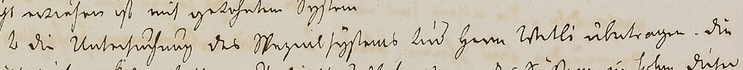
4. Die Untersuchtung des Spezialsystems wird Herrn Wetli übertragen. Die
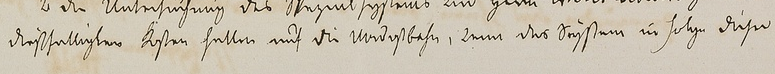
dießfälligen Kosten fallen auf die Nordostbahn, wenn das System in Folge dieser
